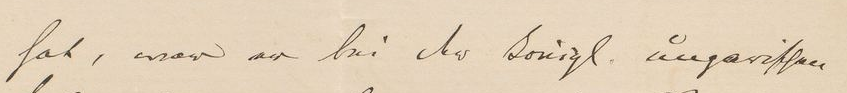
hat, war er bei der königl. ungarischen
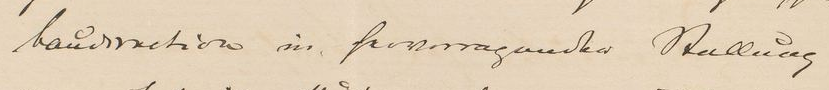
Baudirection in hervorragender Stellung
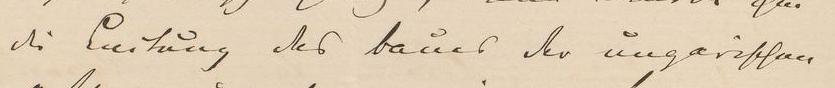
die Leitung des Baues der ungarischen
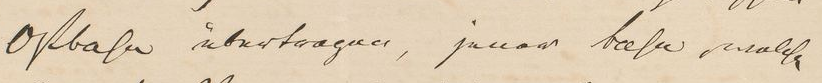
Ostbahn übertragen, jener Bahn, welche
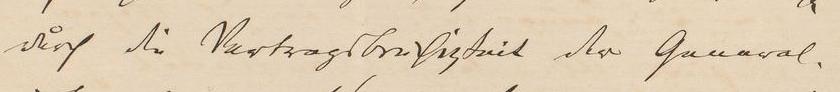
durch die Vertragsbrüchigkeit der General-
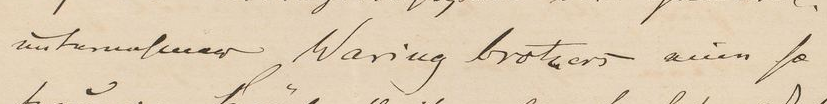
unternehmer Waring Brothers eine so
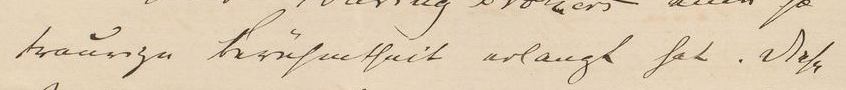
traurige Berühmtheit erlangt hat. Diese
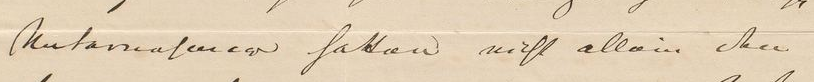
Unternehmer hatten nicht allein den
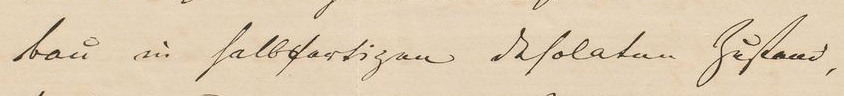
Bau in halbfertigen desolaten Zustand,
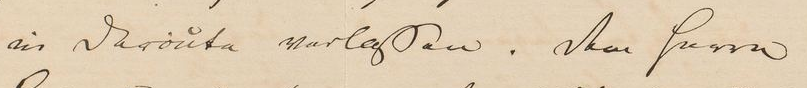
in Deroute verlassen. Dem Herrn
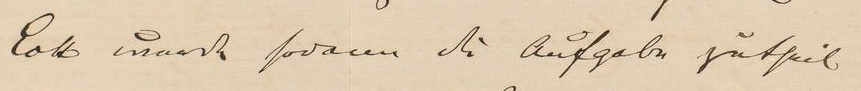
Lott wurde sodann die Aufgabe zutheil
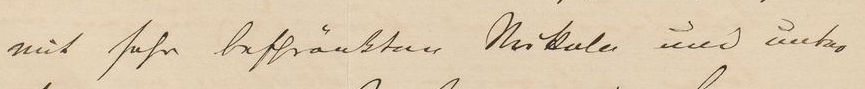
mit sehr beschränkten Mitteln und unter
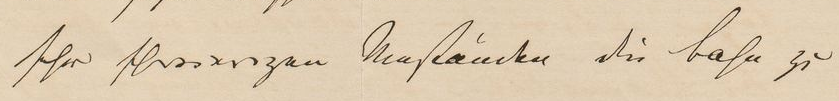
sehr schwierigen Umständen die Bahn zu
